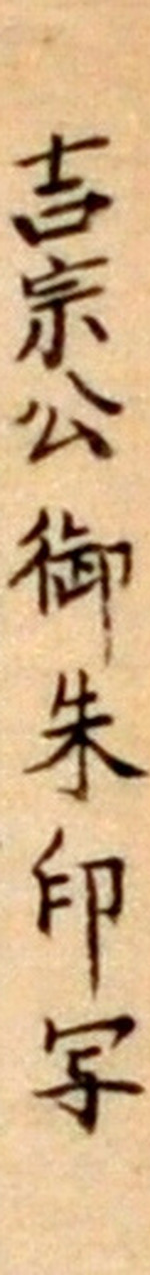吉宗公御朱印写
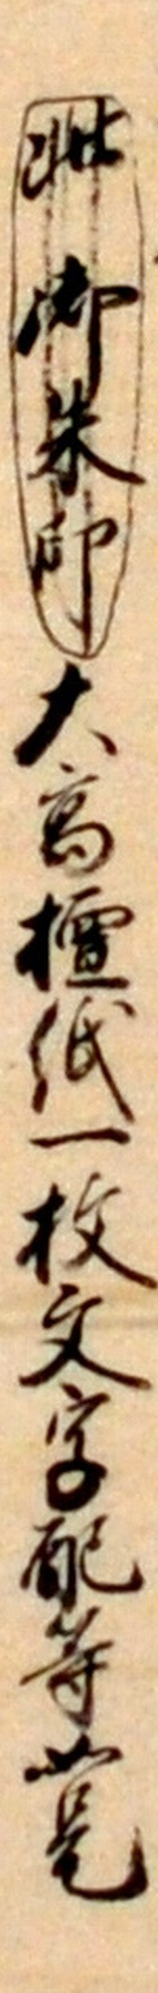此御朱印大高檀紙一枚文字配等如是
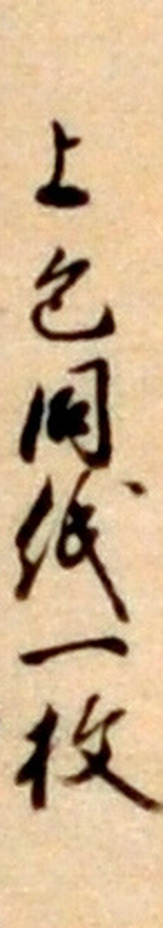上包同紙一枚
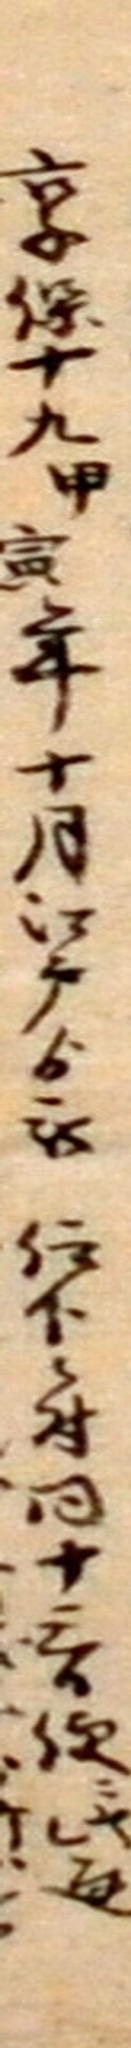享保十九公甲寅年十月江戸ゟ被仰下ニ付同十三日便ニ此通
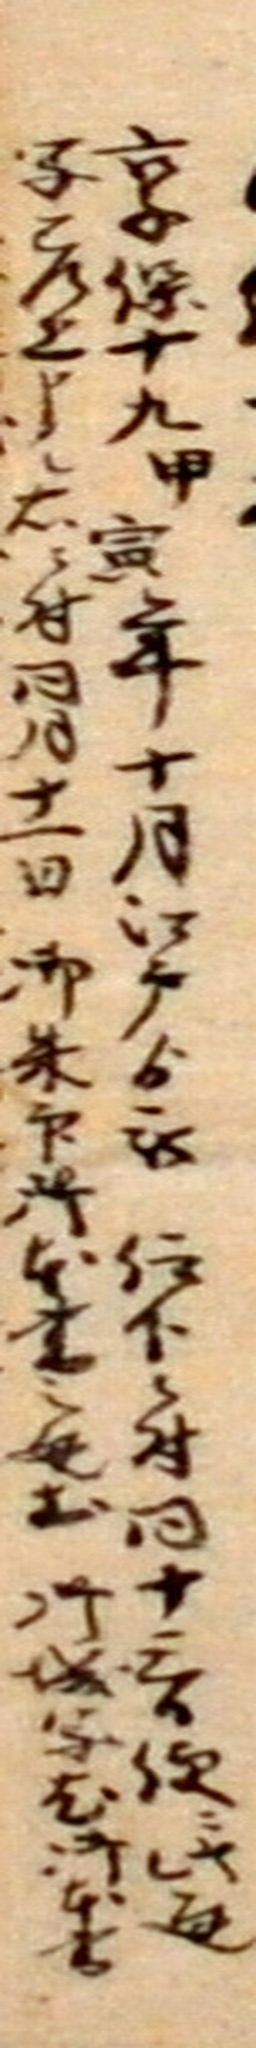写差上候右ニ付同月十一日御朱印御本書之通書御写尤御本書

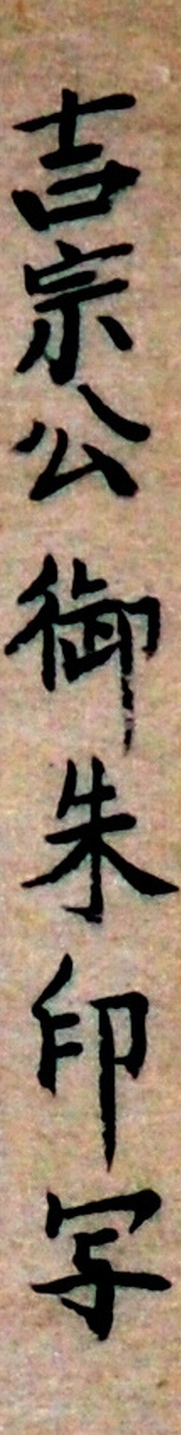吉宗公御朱印写
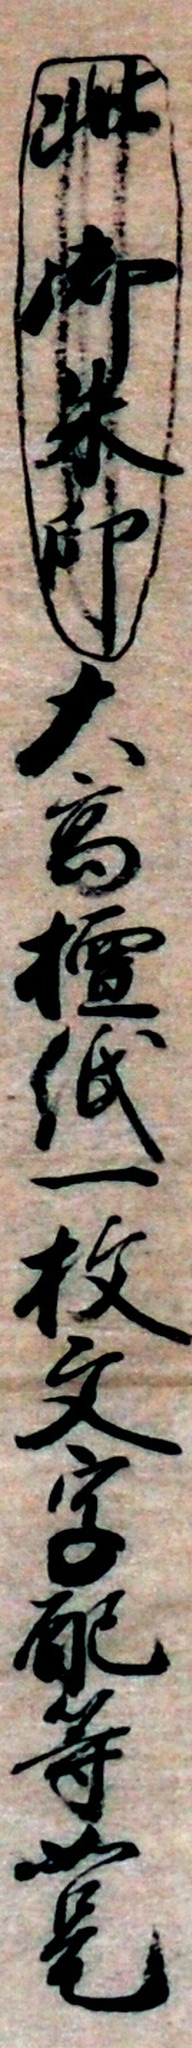此御朱印大高檀紙一枚文字配等如是
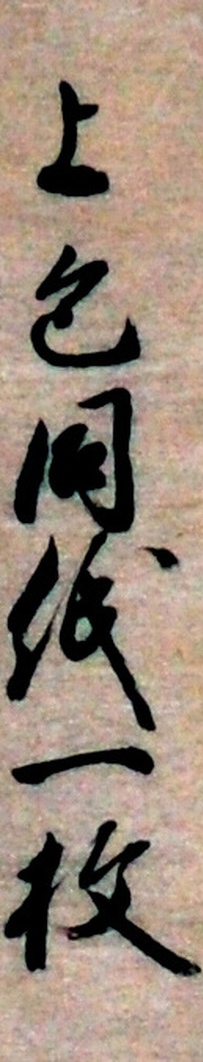上包同紙一枚
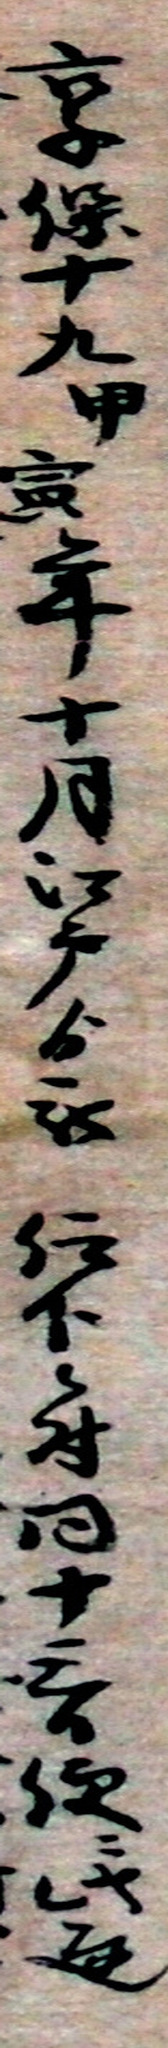享保十九公甲寅年十月江戸ゟ被仰下ニ付同十三日便ニ此通
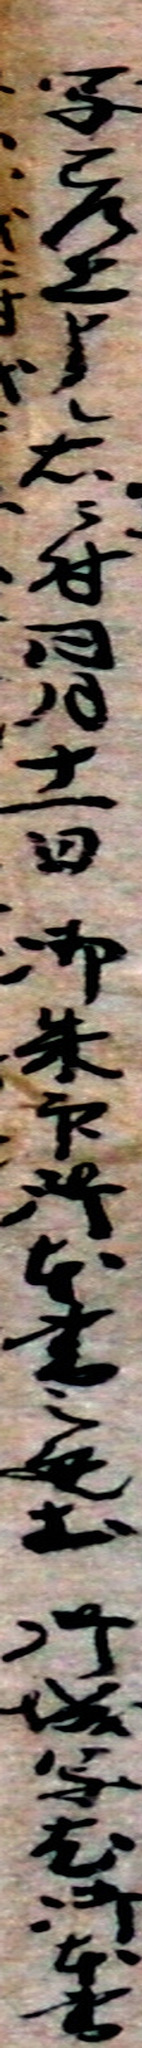写差上候右ニ付同月十一日御朱印御本書之通書御写尤御本書
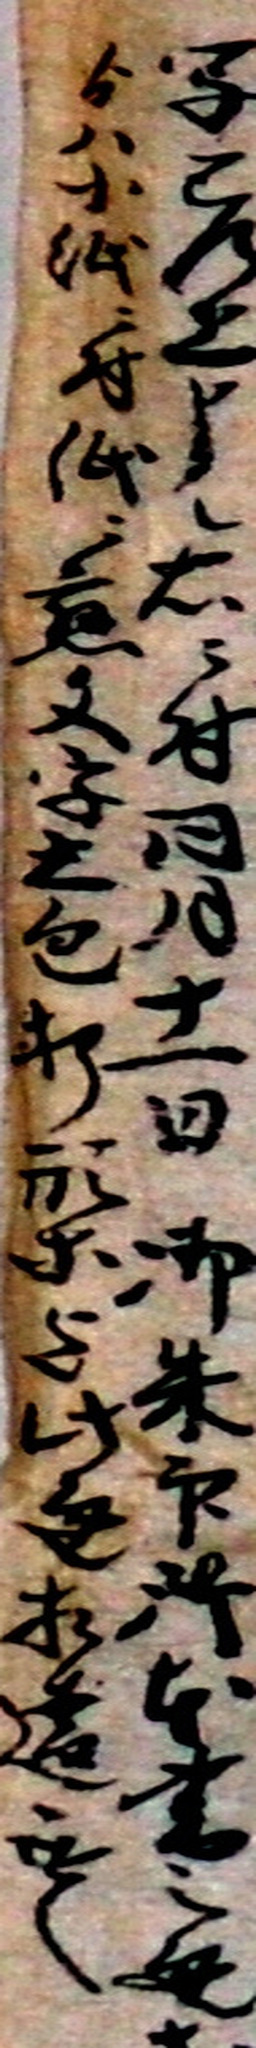ゟハ小紙ニ付紙ニ応文字上包折形等迄此通相違無之
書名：包紙
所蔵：伊那市立高遠町図書館・合同会社AMANE
